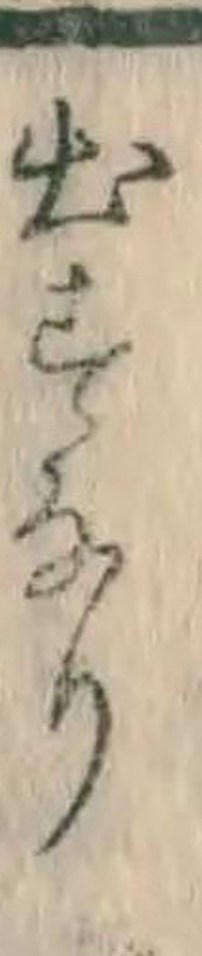出すなり
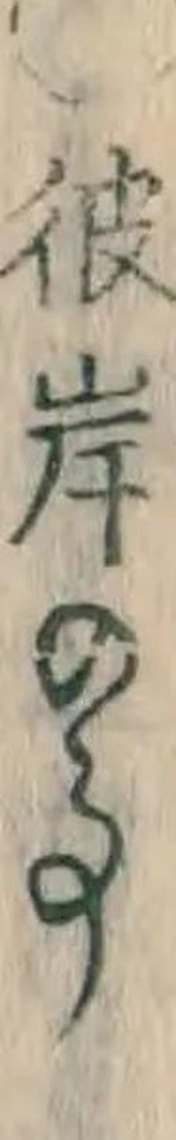○彼岸の事
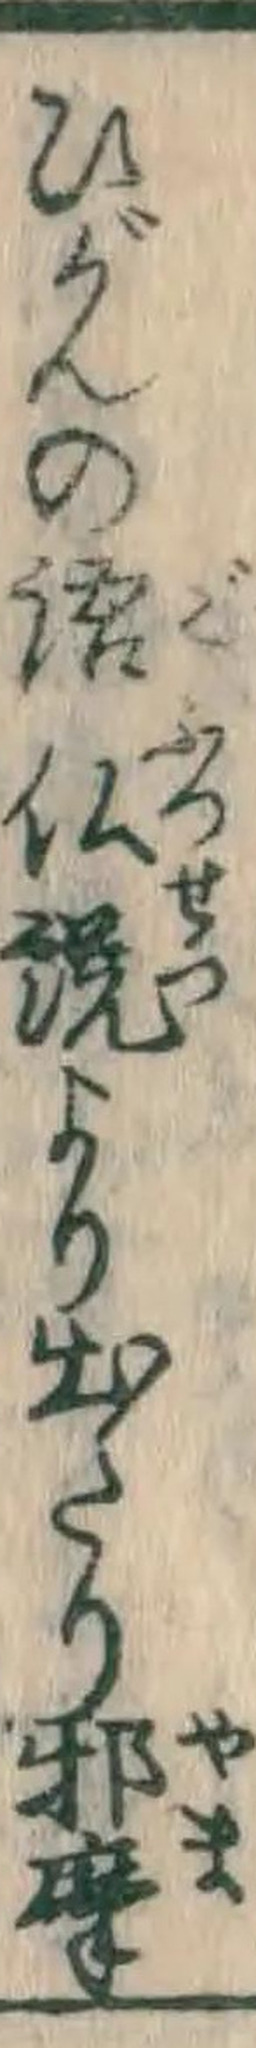ひがんの語仏説より出たり邪摩
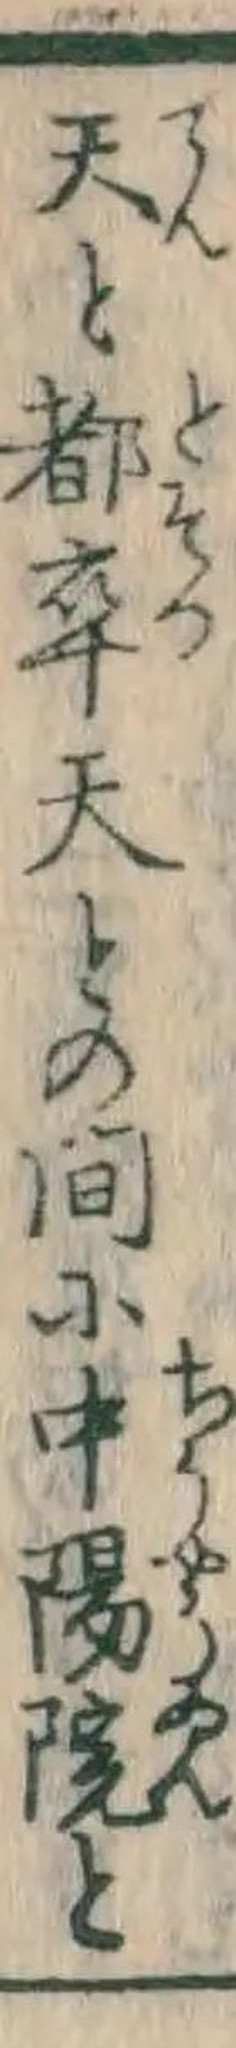天と都卒天との間に中陽院と

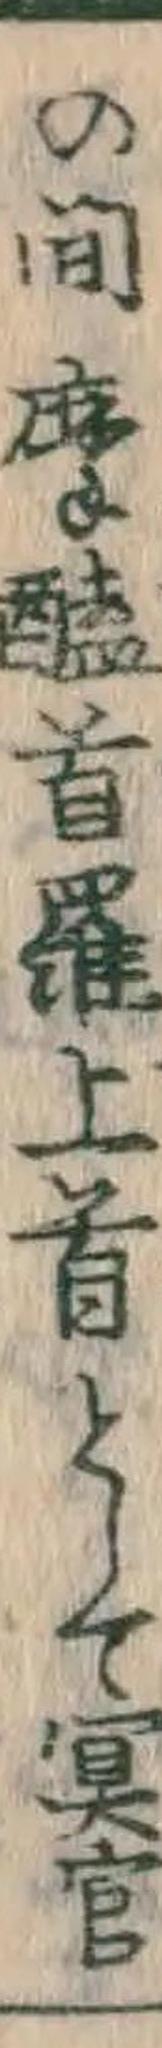の間摩醯首羅上首として冥官
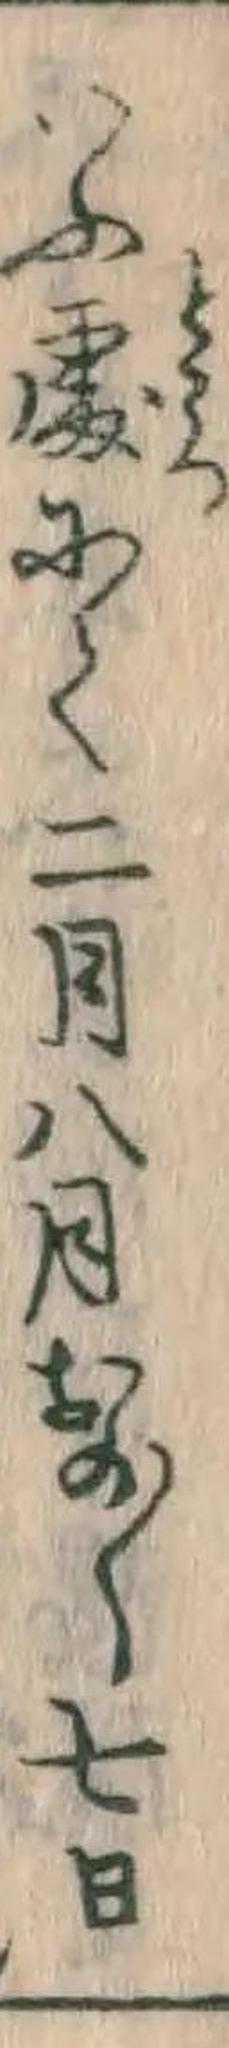いふ処にて二月八月おの〳〵七日
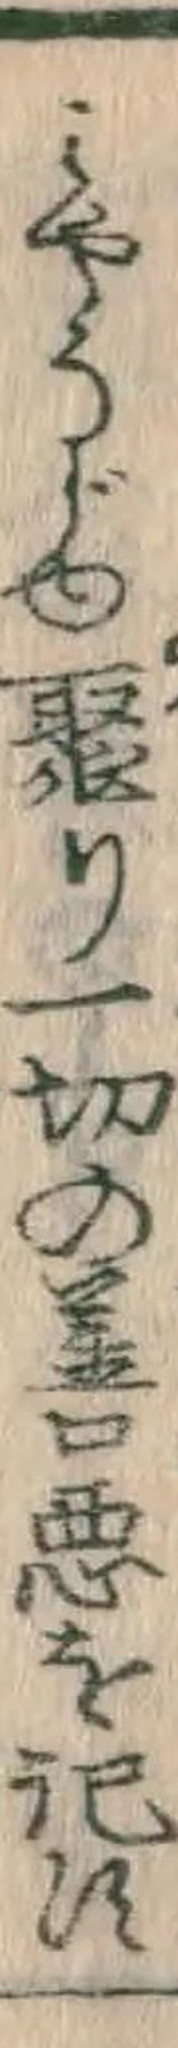みやうじゆ聚り一切の善悪を記す
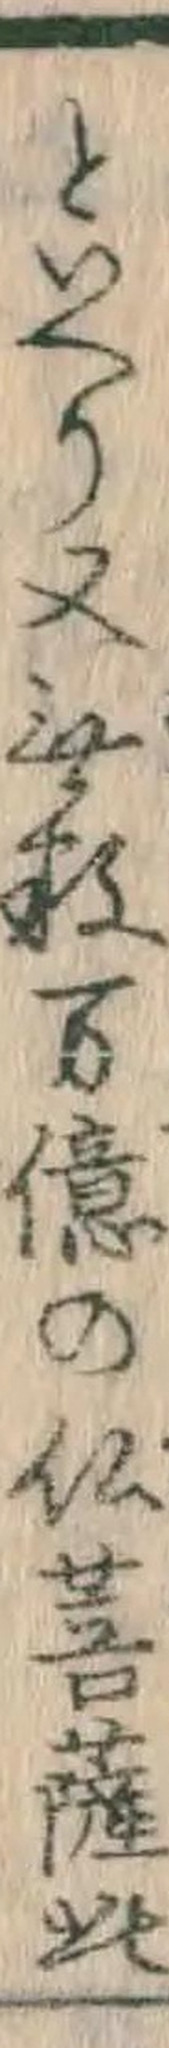といへり又無数万億の仏菩薩此
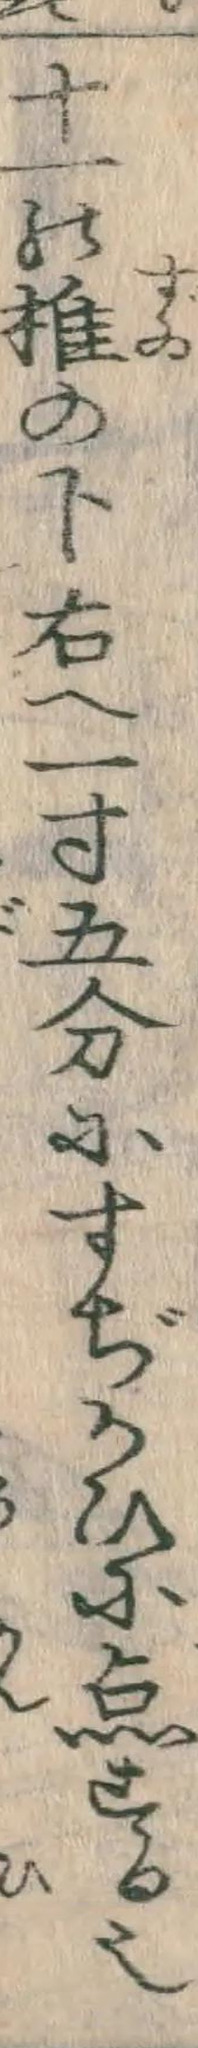十一の椎の下右へ一寸五分にすぢかひに点する也
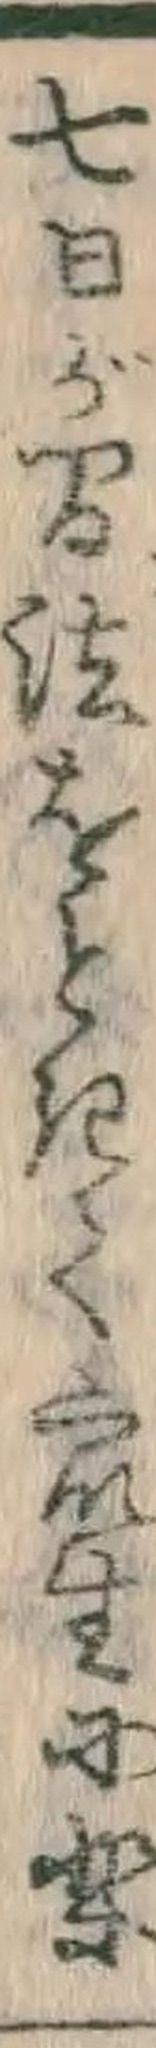七日が間法をときて衆生に楽
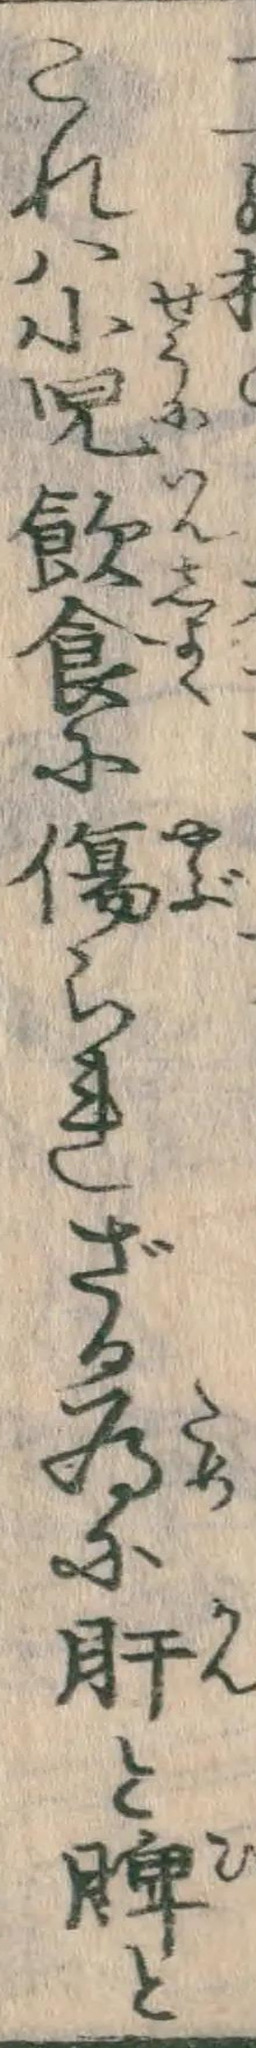これは小児飲食に傷られざる為に肝と脾と
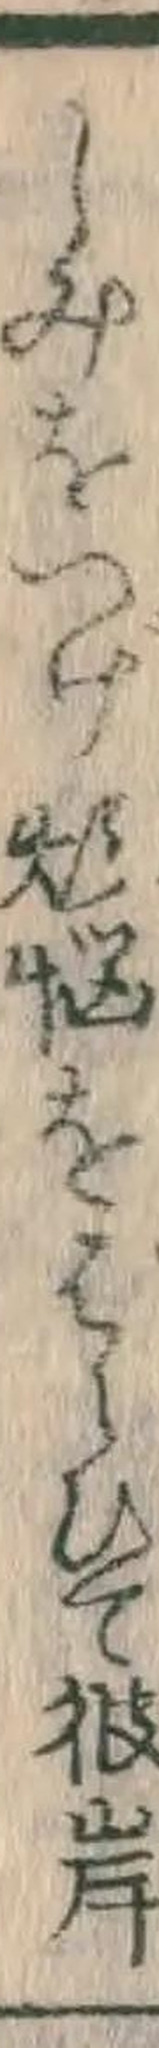しみをつげ煩悩をはらひて彼岸
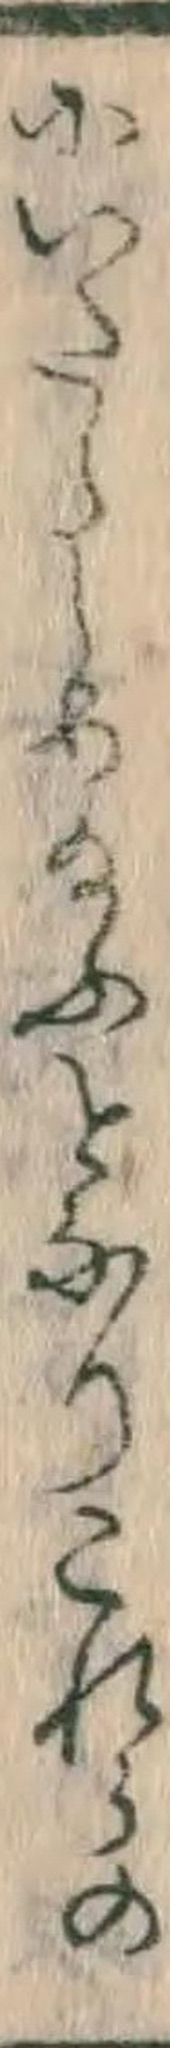にいたらしめ給ふとなりこれらの
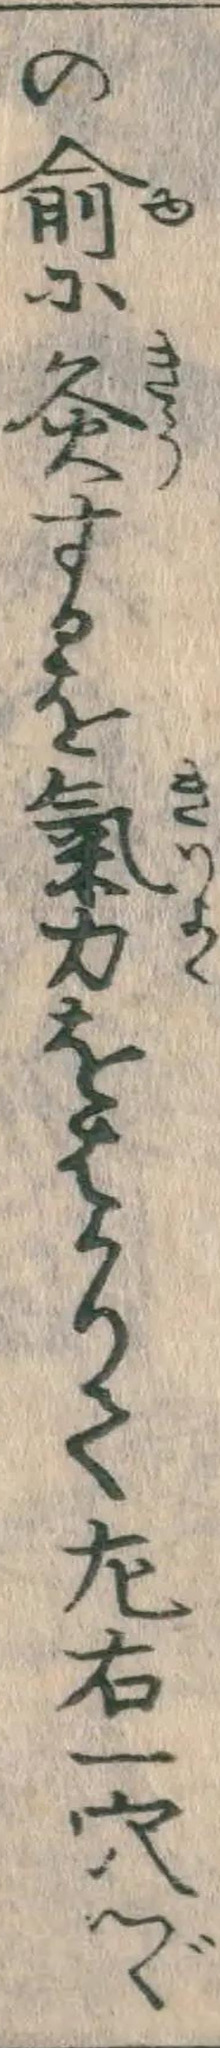の兪に灸するを気力をはかりて左右一穴づゝ
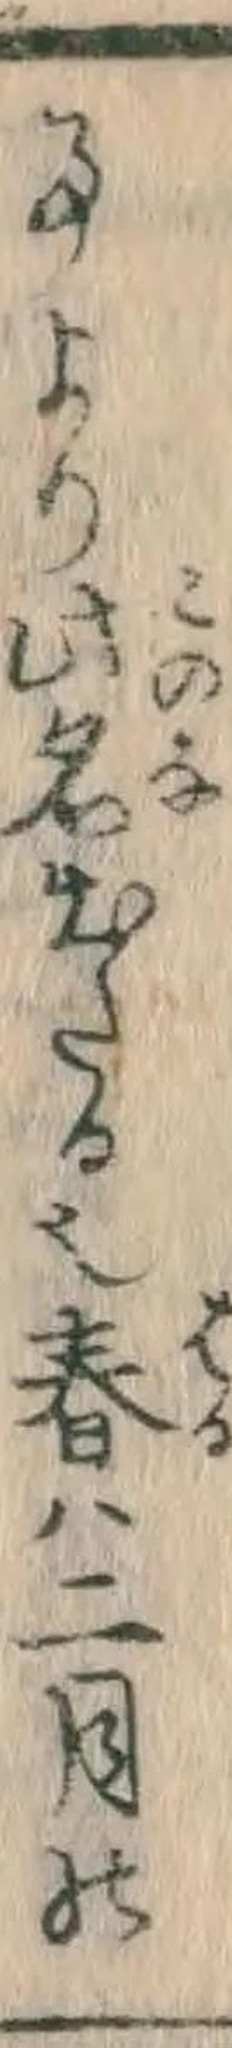事より此名出たる也春は二月の
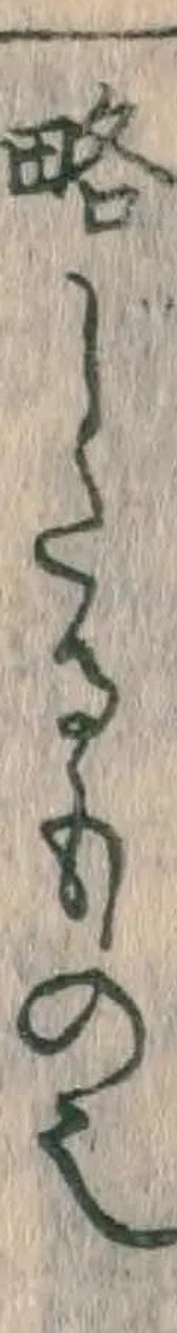略したるもの也
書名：広益秘事大全 3巻. [4]
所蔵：国立国会図書館 National Diet Library, JAPAN
